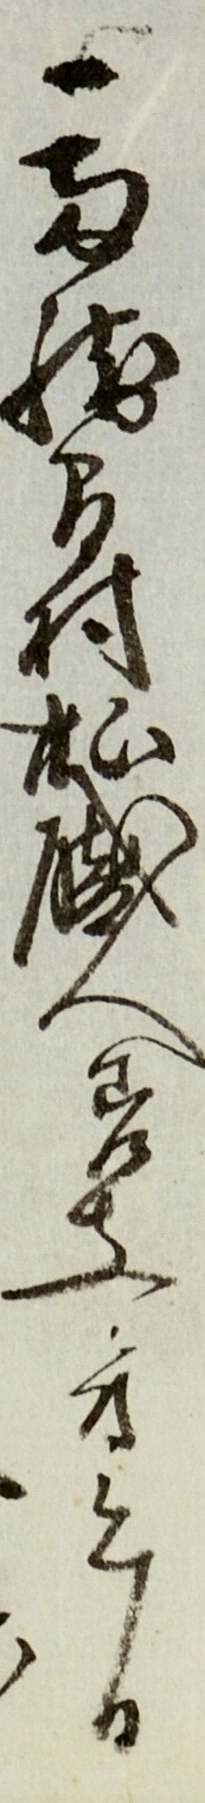一両勝間村杣職人差支ニ付今日
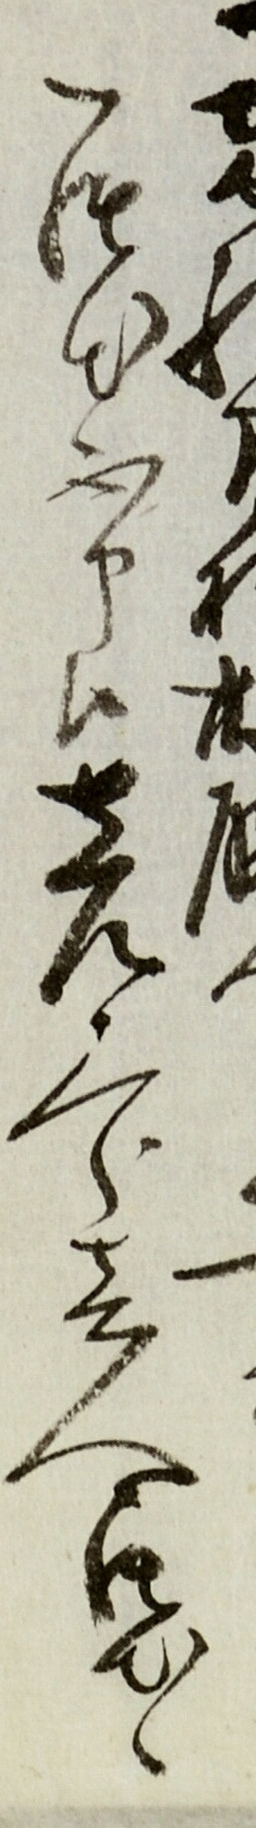罷出不申候吉三郎壱人罷出候
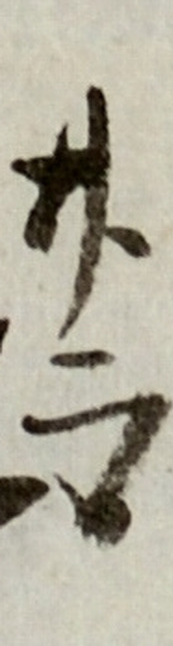廿二日
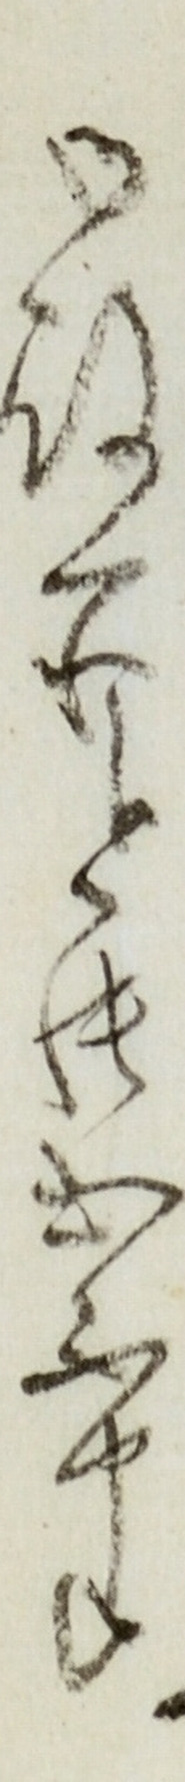御役所江罷出不申候
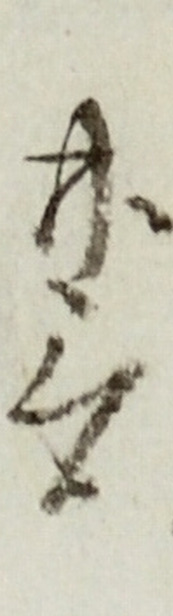廿三日
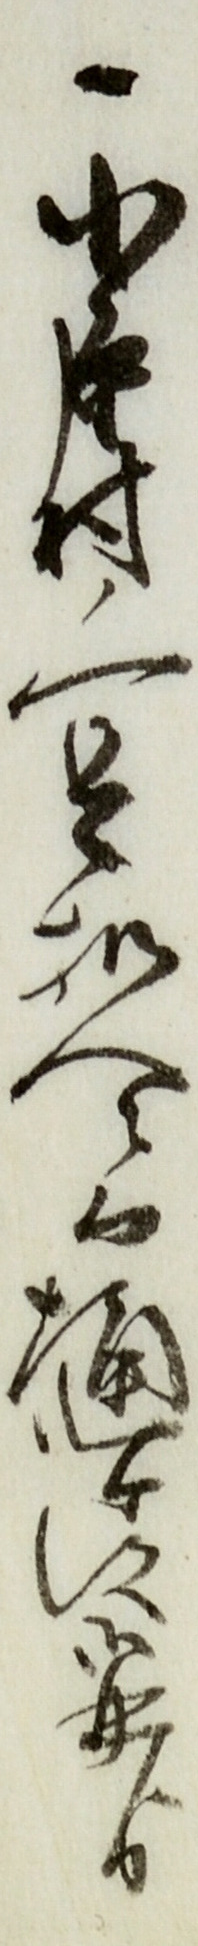一小原村人足拾人ニ而樋ケ沢御林ゟ

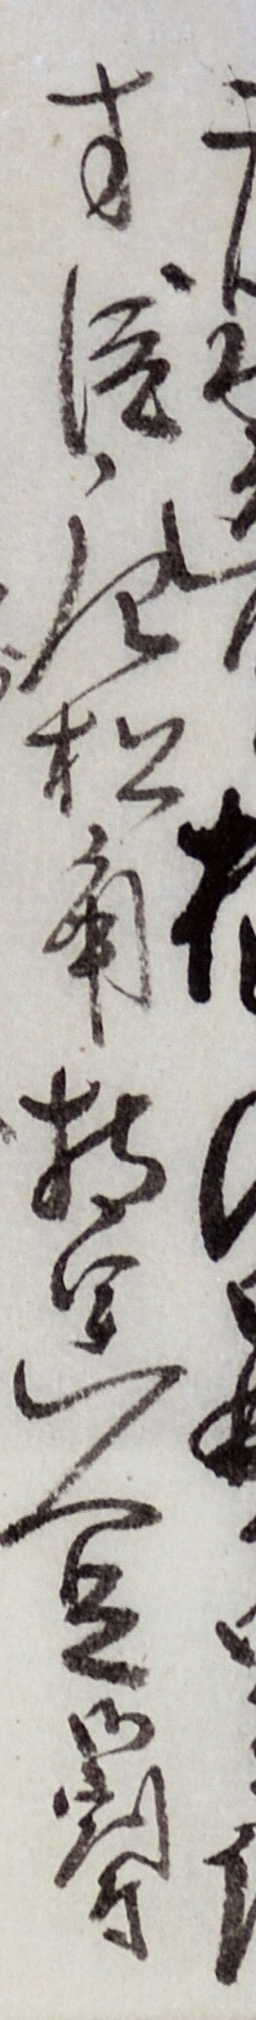方渡唐松角持運人足御割付
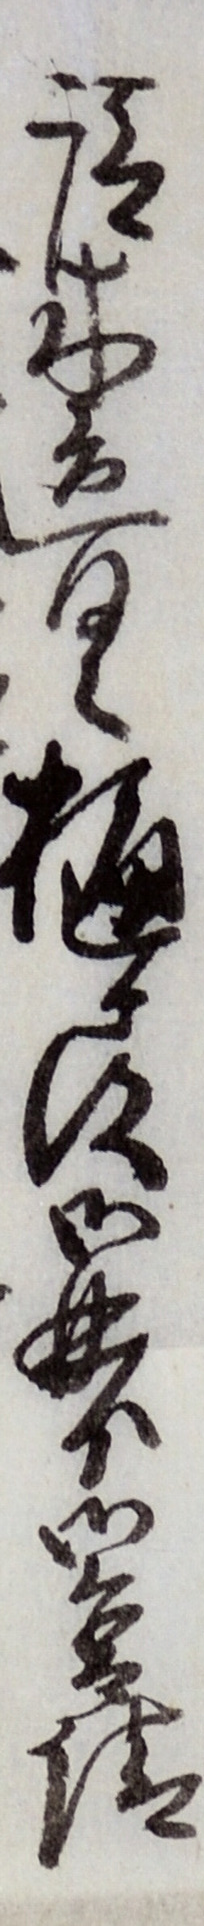請木道具樋ケ沢御林ゟ御普請
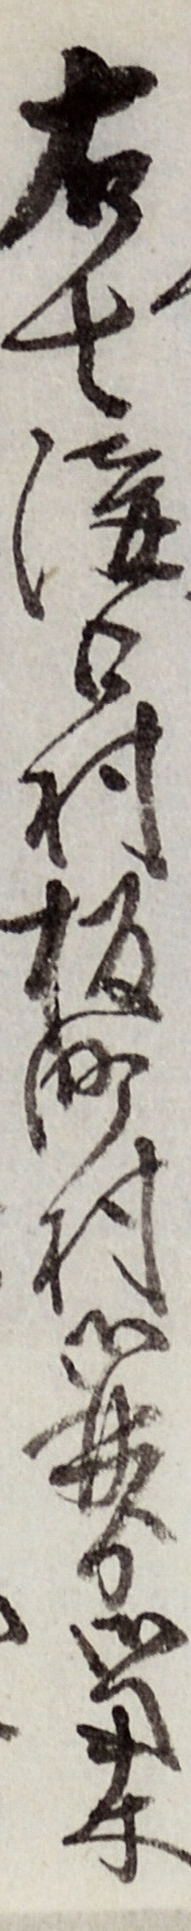右者溝口村板町村御林ゟ御用木
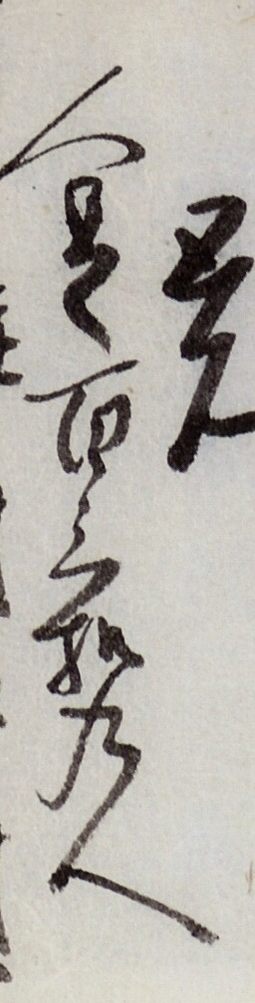人足百三拾九人
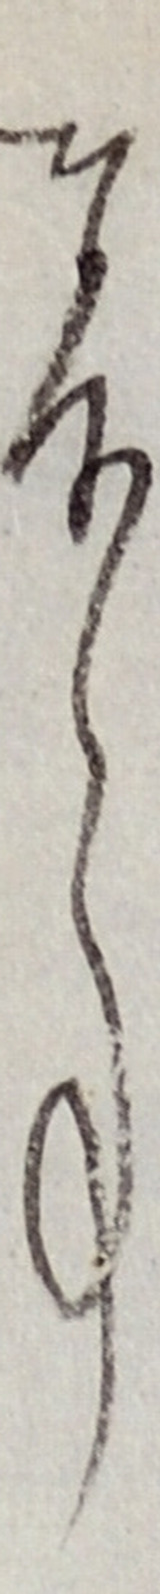奉存候事
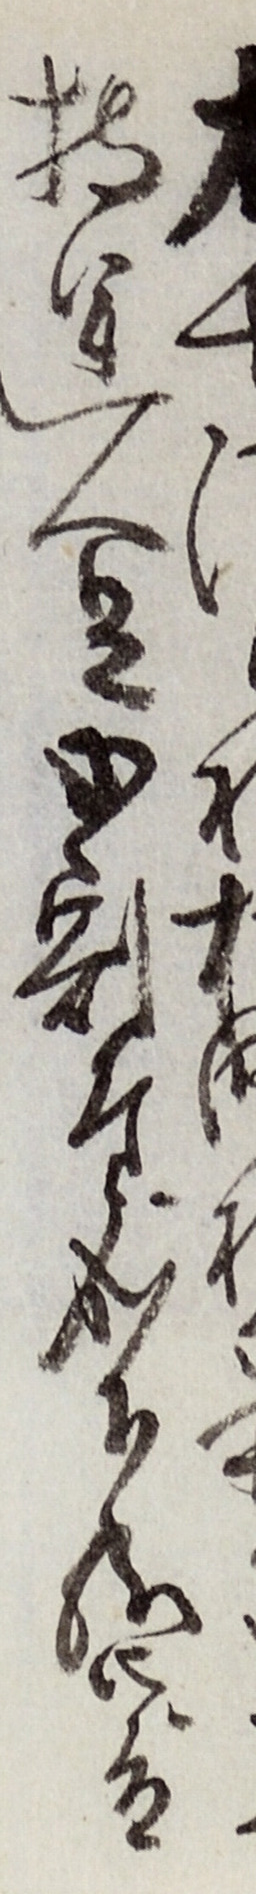持運人足御割付被成下候様此度
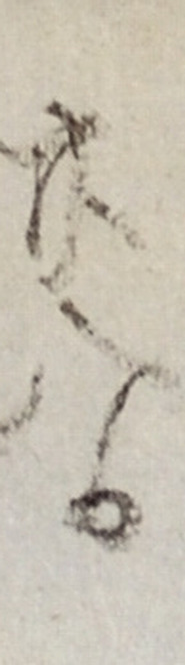廿八日
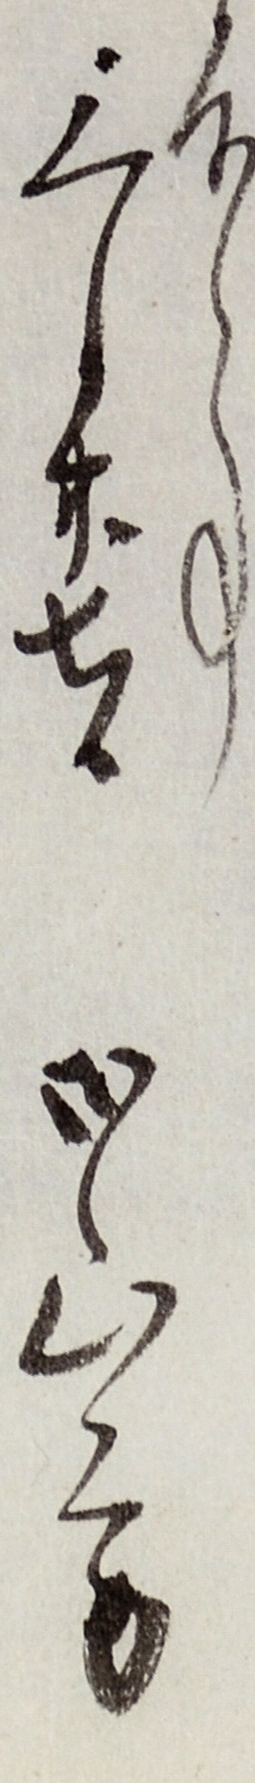三月廿七日御山方
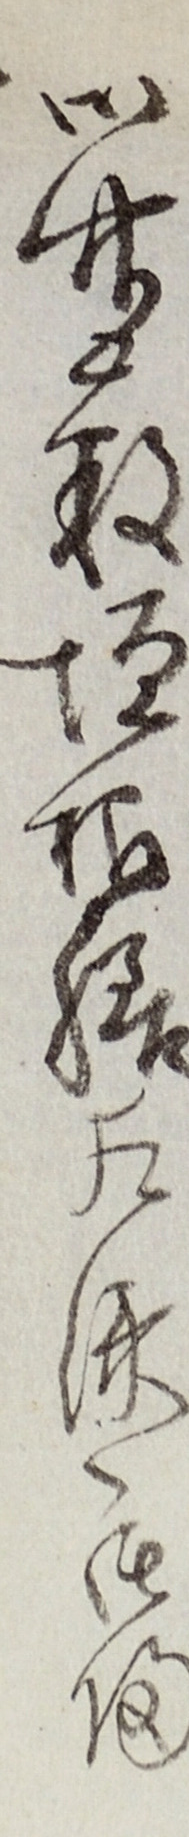御竹薮垣根繕相済罷帰
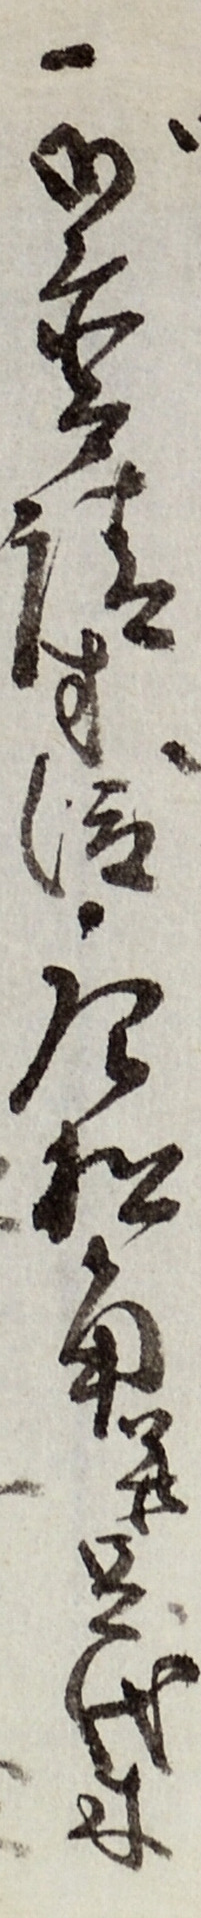一御普請方渡唐松角并足代木
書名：御山方御薪方諸事御用留
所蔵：伊那市立高遠町図書館・合同会社AMANE
